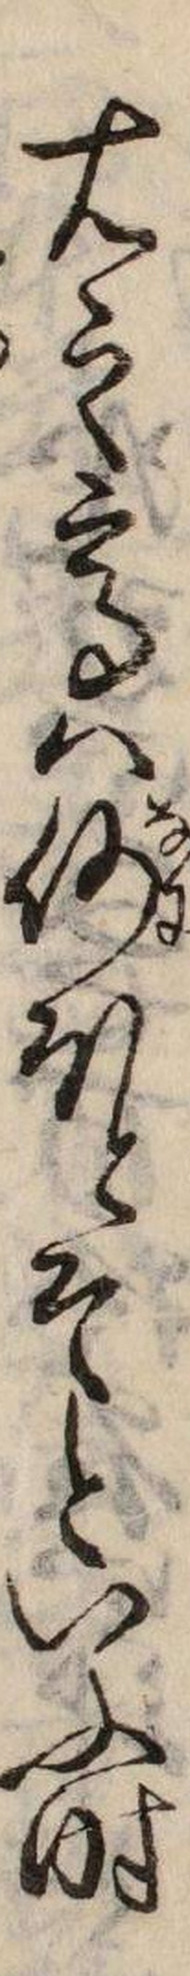右の高は何ほとそといふ時
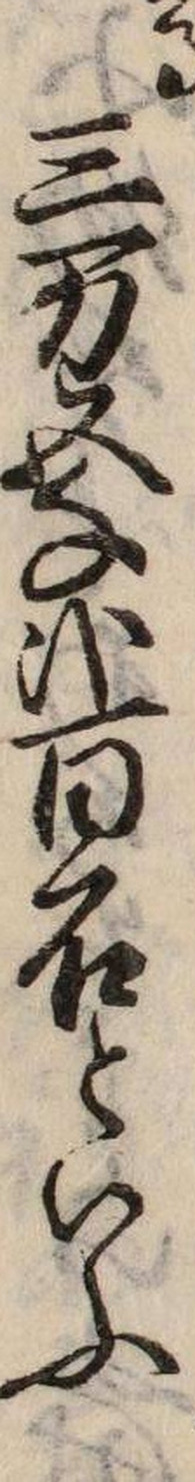高三万五千弐百石といふ
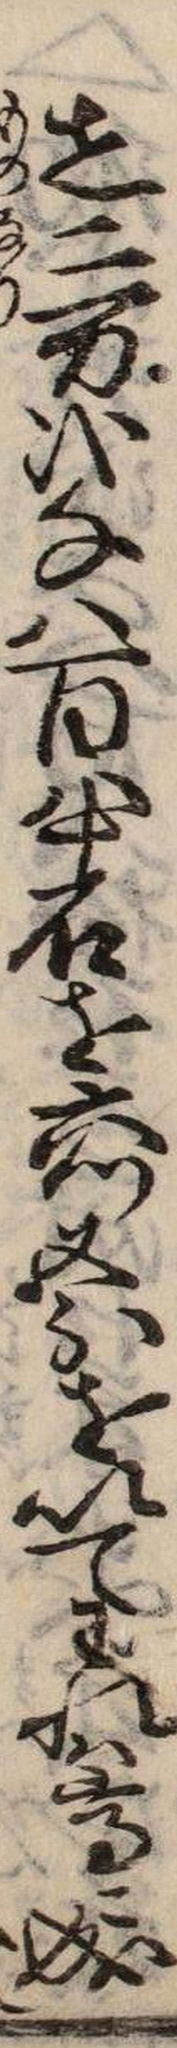先二万弐千八百八十石を六つ五分を以てわれは高に成なり
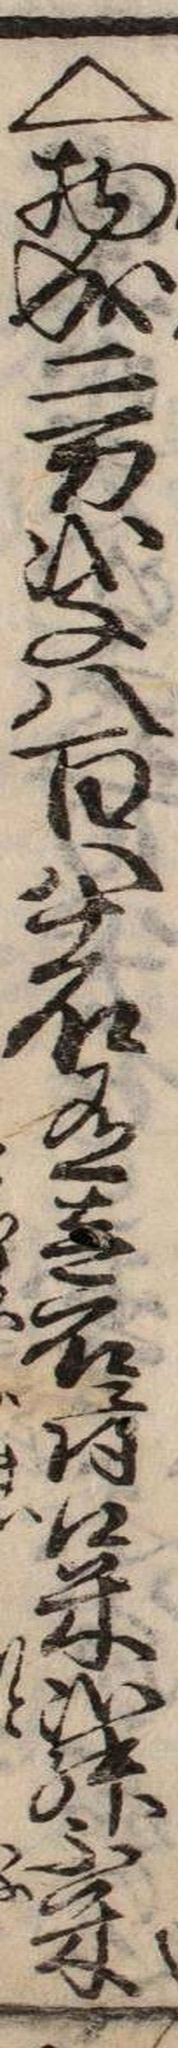△物成二万弐千八百八十石有壱石に付口米弐舛ふ米
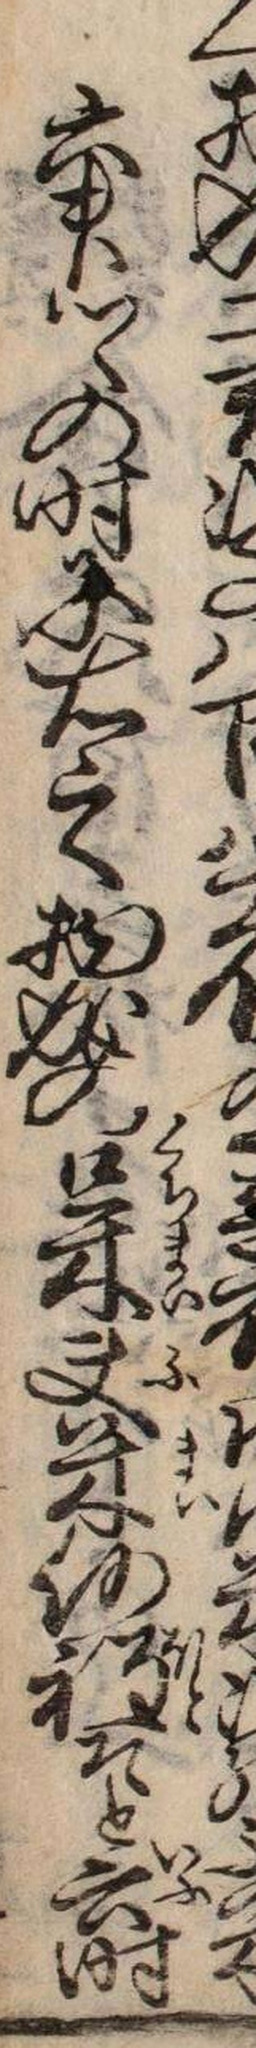六升つゝの時に右の物成の口米夫米何程そと云時

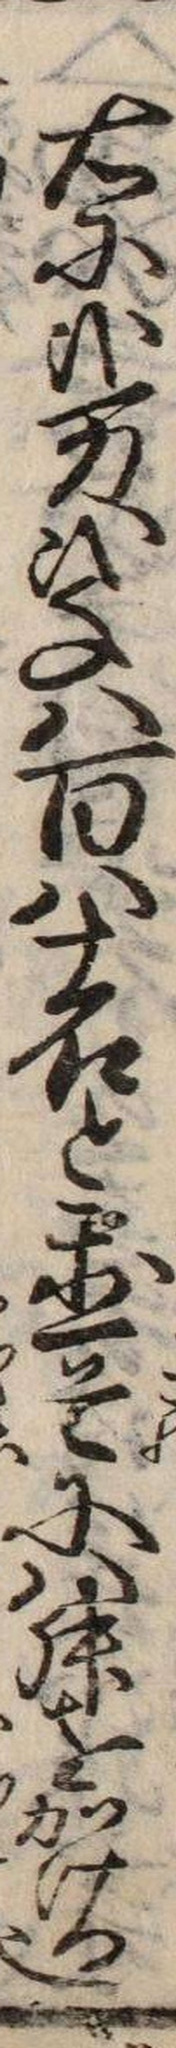右に弐万弐千八百八十石と置是に八舛をかける也
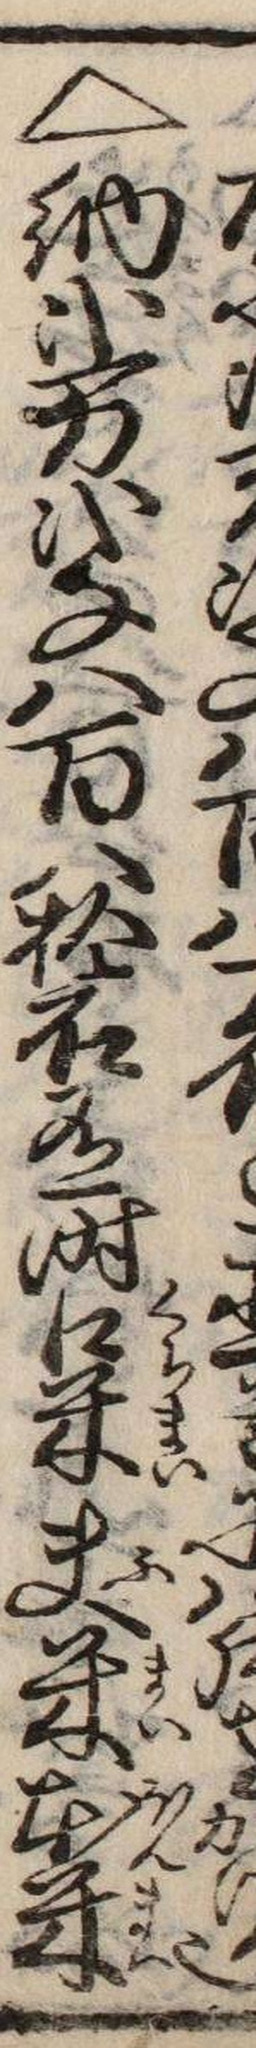△納弐万弐千八百八拾石有時口米夫米本米
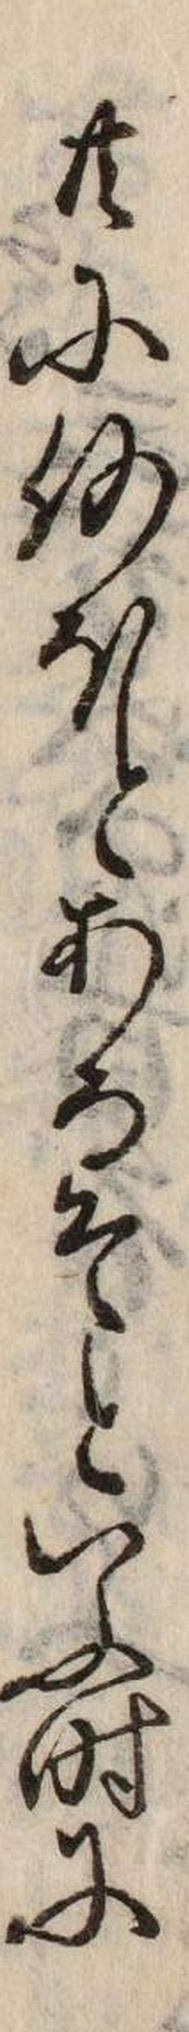共に何ほとあるそといふ時に
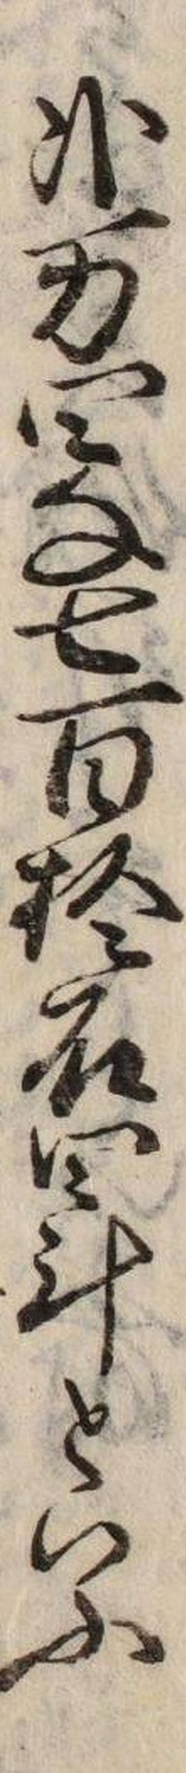弐万四千七百拾石四斗といふ
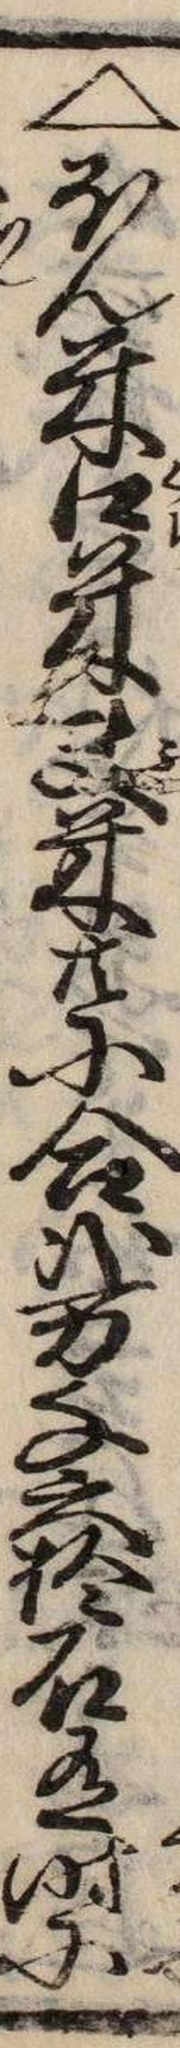△ほん米口米夫米共に合弐万千六拾石有時に
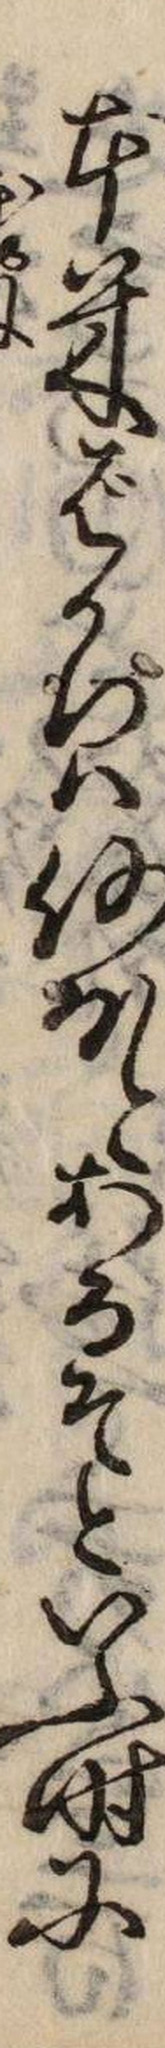本米ばかりは何ほとあるそといふ時に
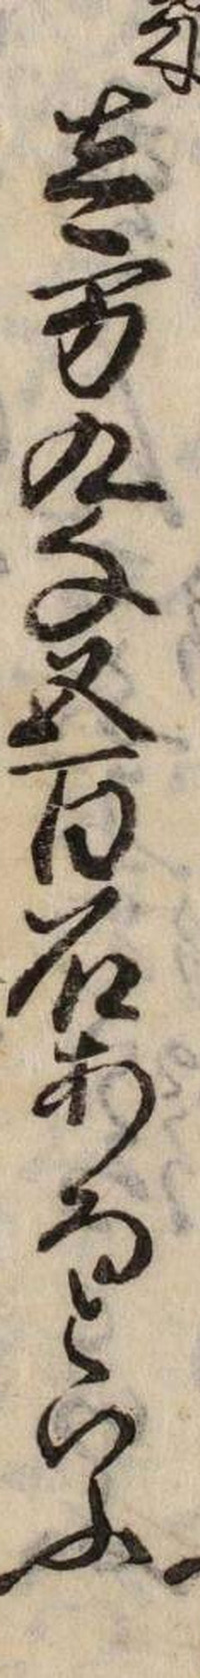本米壱万九千五百石あるといふ
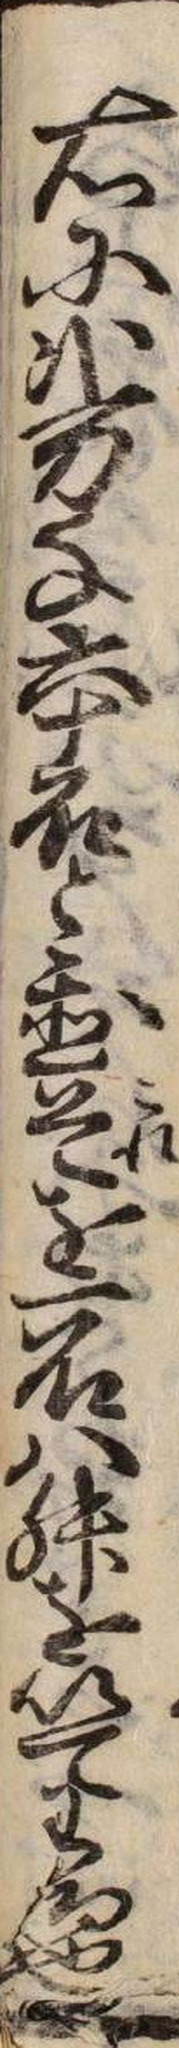右に弐万千六十石と置是を一石八舛を以てわる也
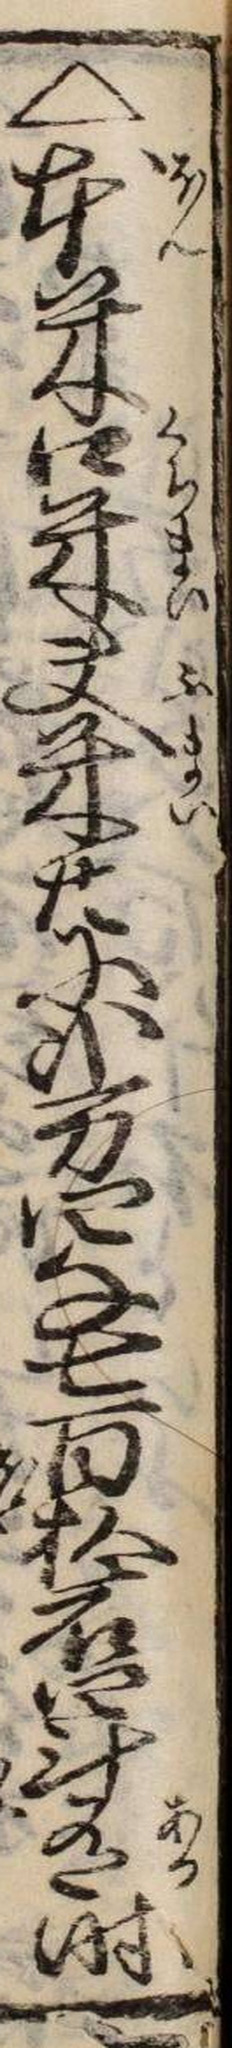△本米口米夫米共に弐万四千七百拾石四斗有時
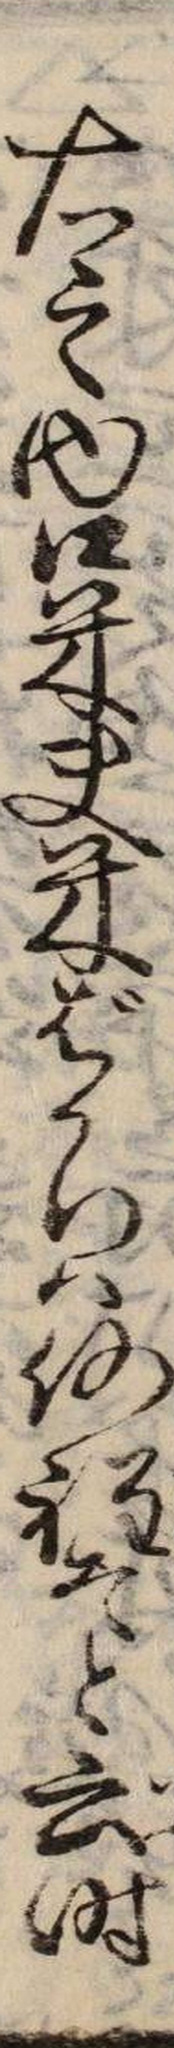右の内口米夫米ばかりは何程そと云時
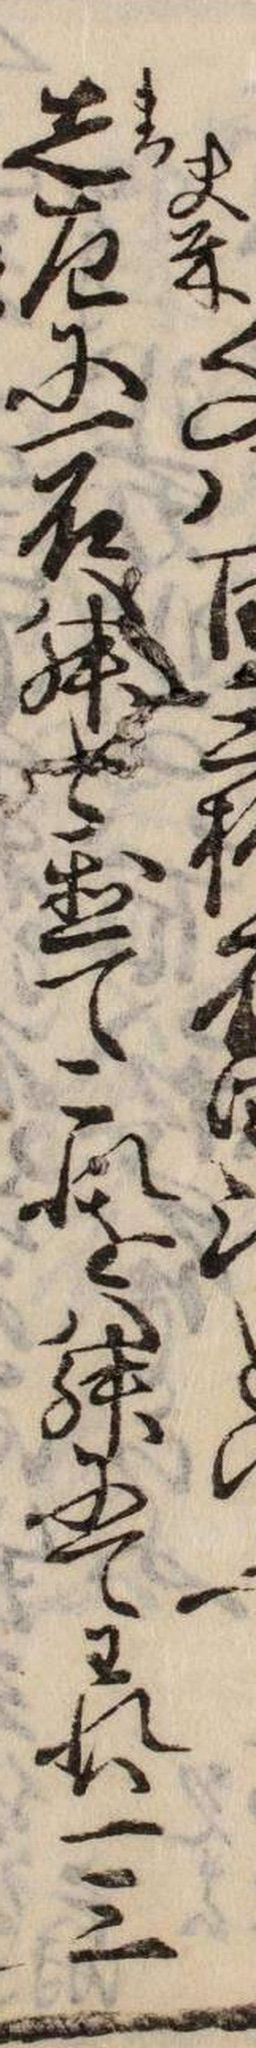先左に一石八舛と置てこれを八舛にてわれは一三
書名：塵劫記（寛永11年自跋、京都府立京都学・歴彩館追貴8）
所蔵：京都府立京都学・歴彩館 国文学研究資料館
